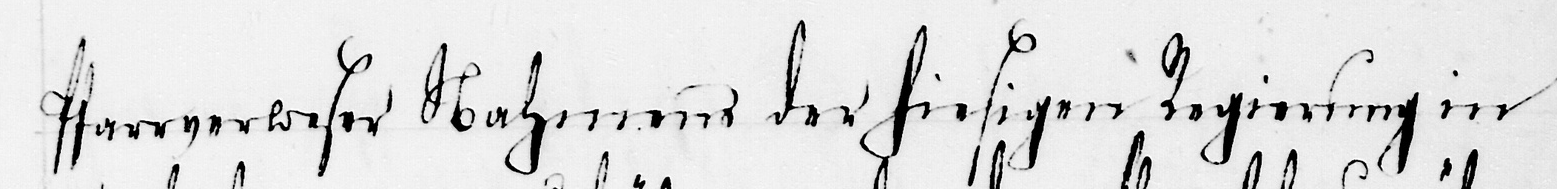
Pfarrverweser Nahmens der hiesigen Regierung in
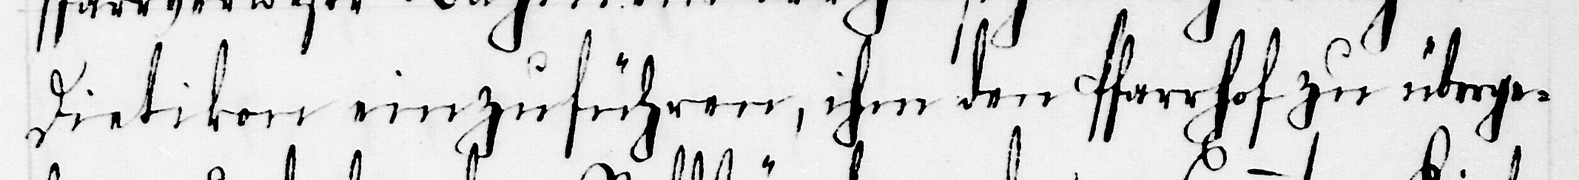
Dietikon einzuführen, ihm den Pfarrhof zu überge¬
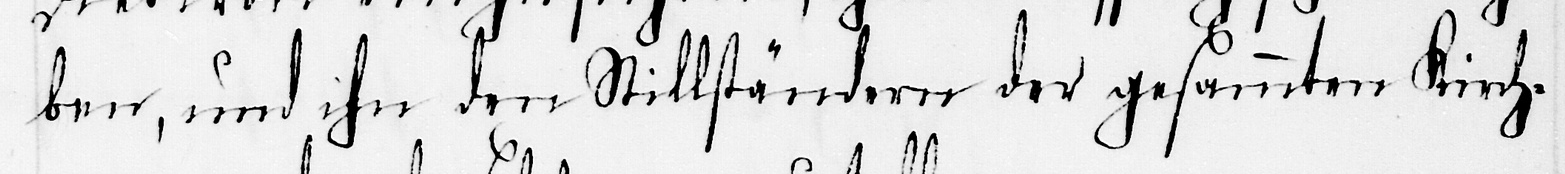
ben, und ihn den Stillständern der gesammten Kirch¬
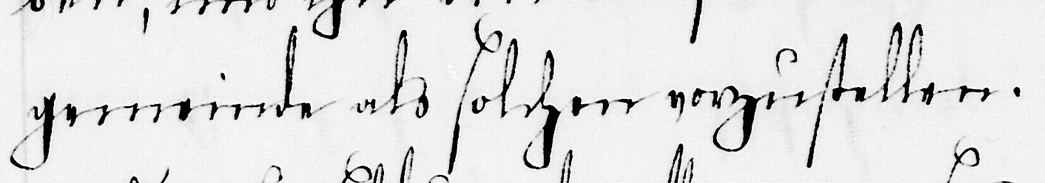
gemeinde als solchen vorzustellen.
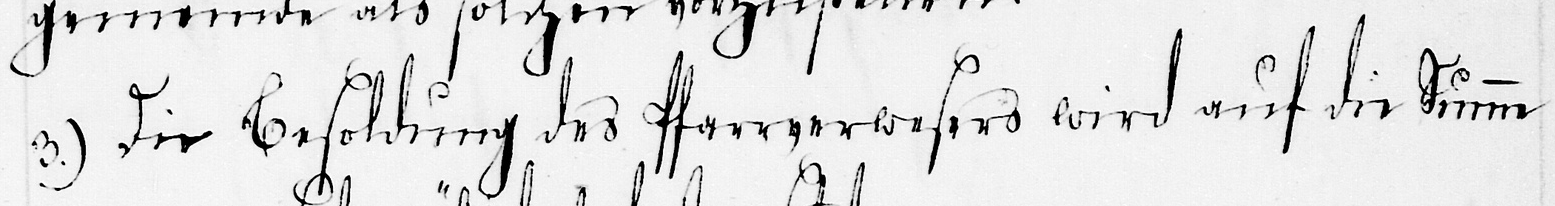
3.) Die Besoldung des Pfarrverwesers wird auf die Summe
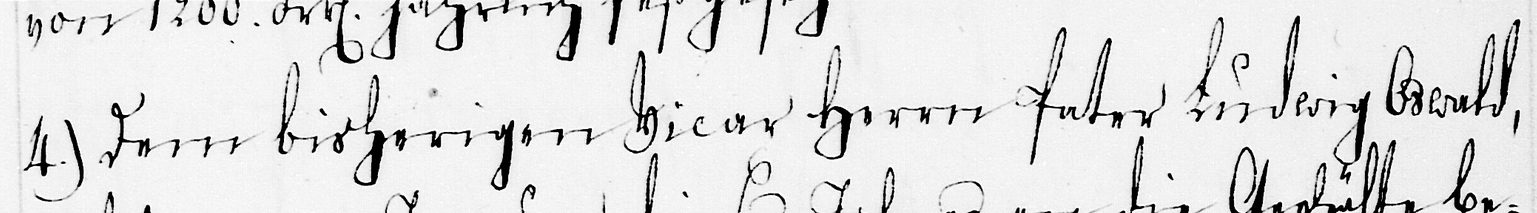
4.) Dem bisherigen Vicar Herrn Pater Ludwig Oswald,
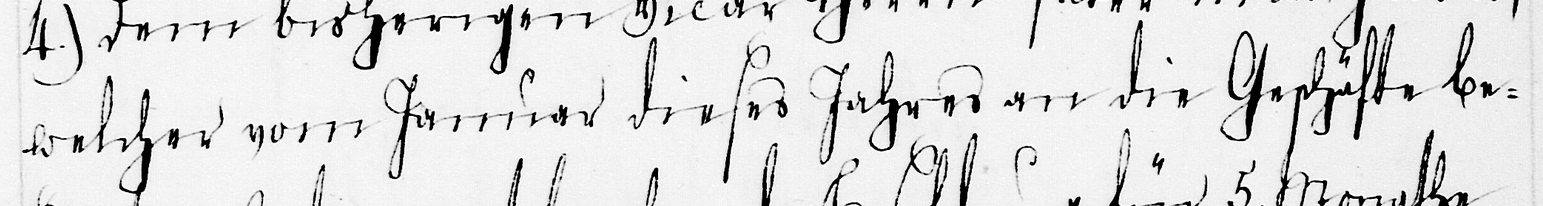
welcher vom Januar dieses Jahres an die Geschäfte be¬
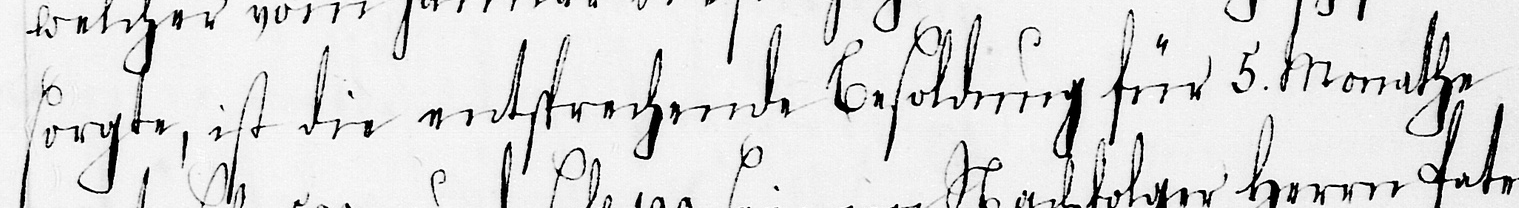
sorgte, ist die entsprechende Besoldung für 5. Monathe
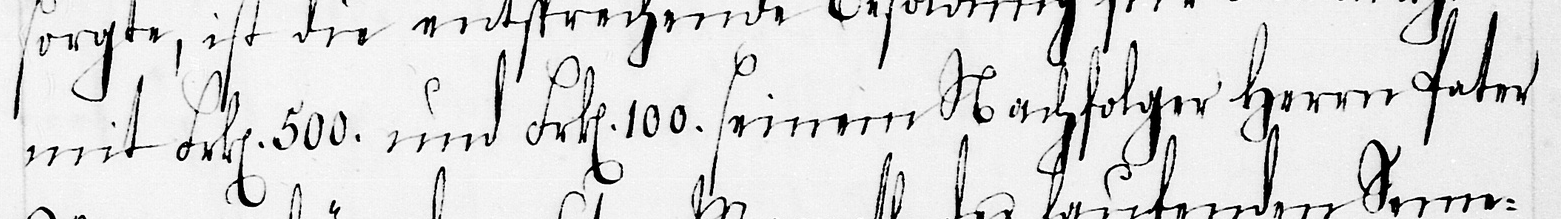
mit Frk[en]. 500. und Frk[en]. 100. seinem Nachfolger Herrn Pater
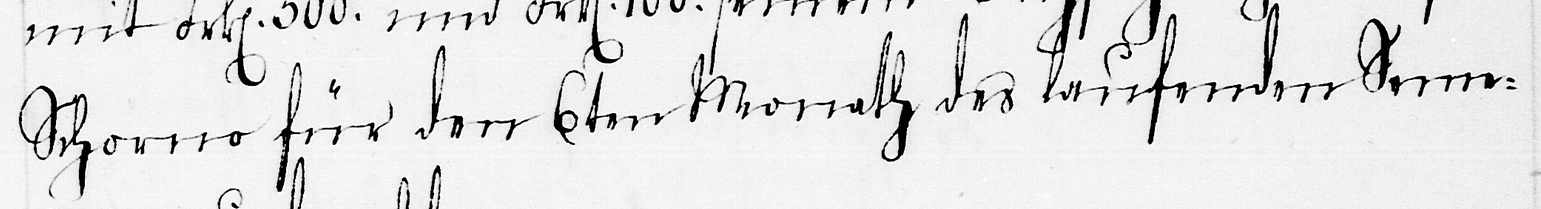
Schorno für den 6ten Monath des laufenden Seme¬
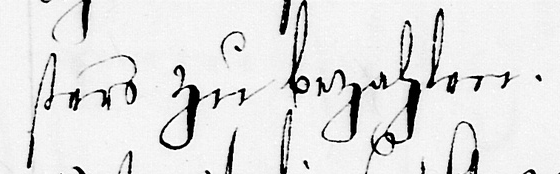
sters zu bezahlen.
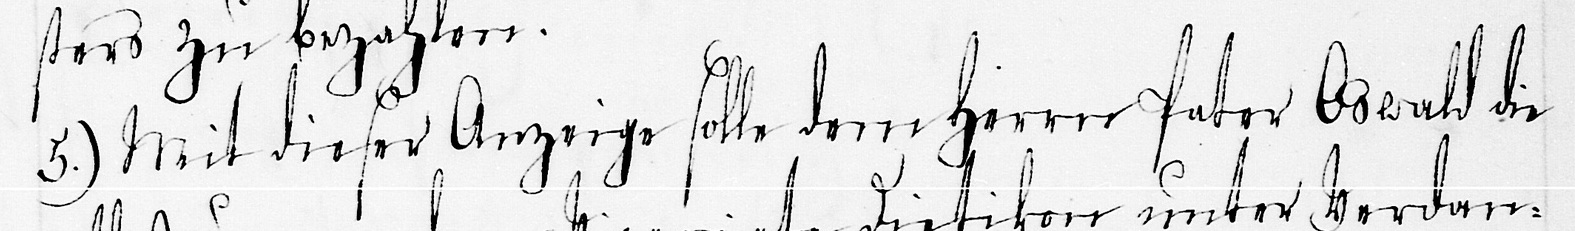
5.) Mit dieser Anzeige solle dem Herrn Pater Oswald die
